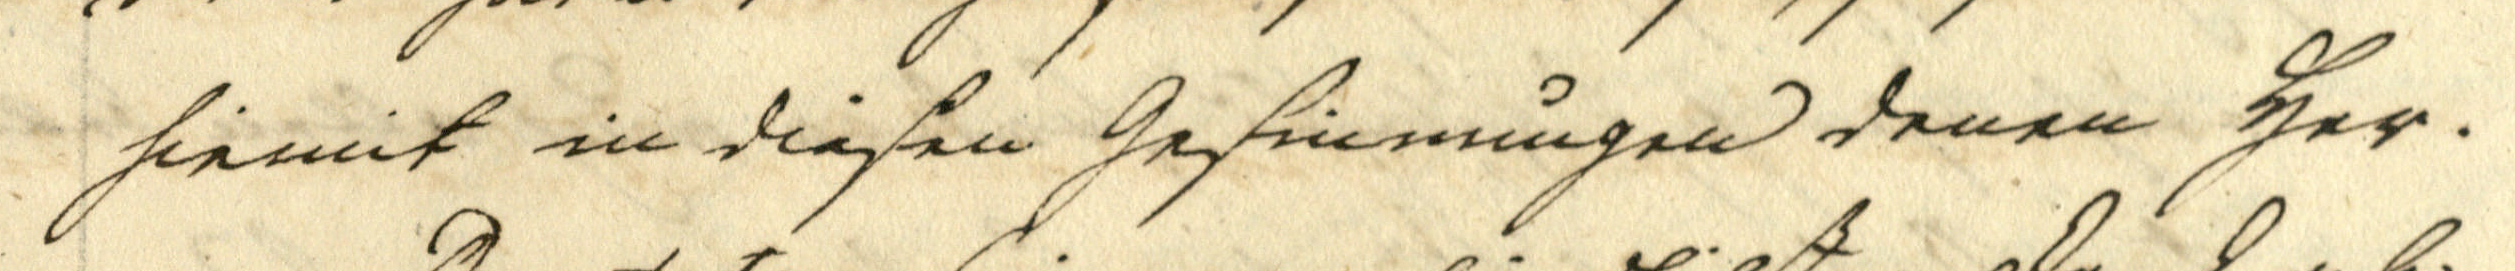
hiemit in diesen Gesinnungen denen Her¬
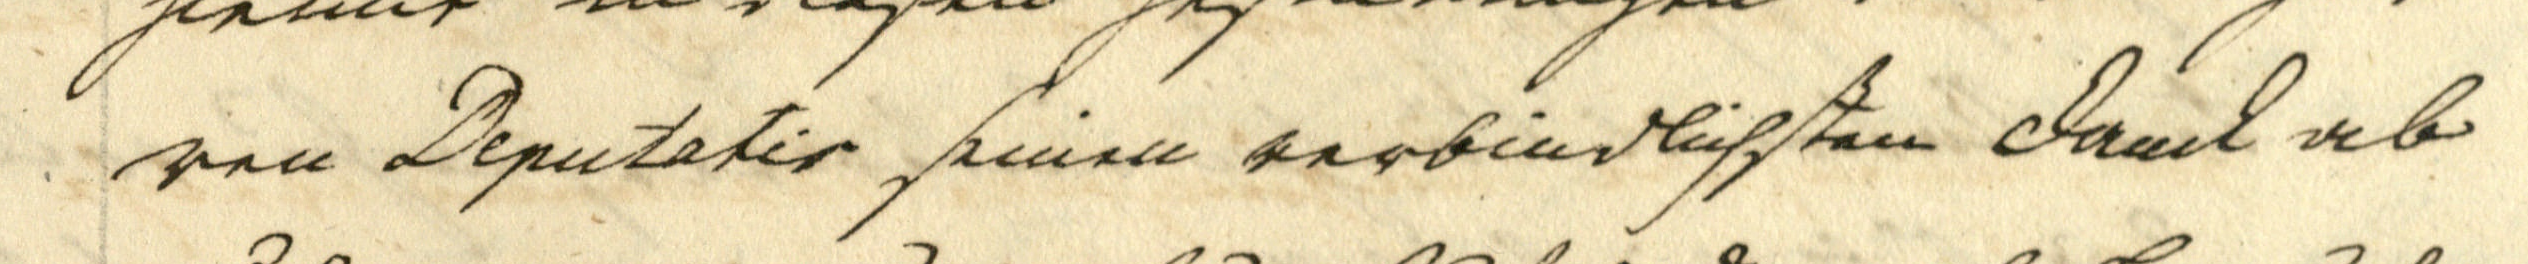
ren Deputatis seinem verbindlichsten Danck ab
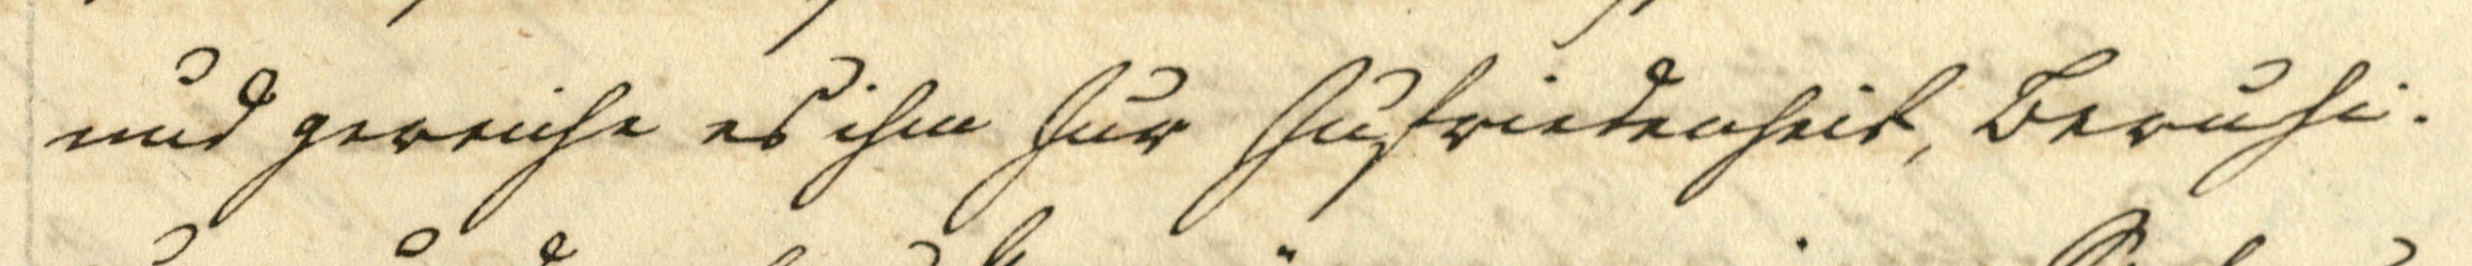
und gereiche es ihm zur Zufriedenheit, Beruhi¬
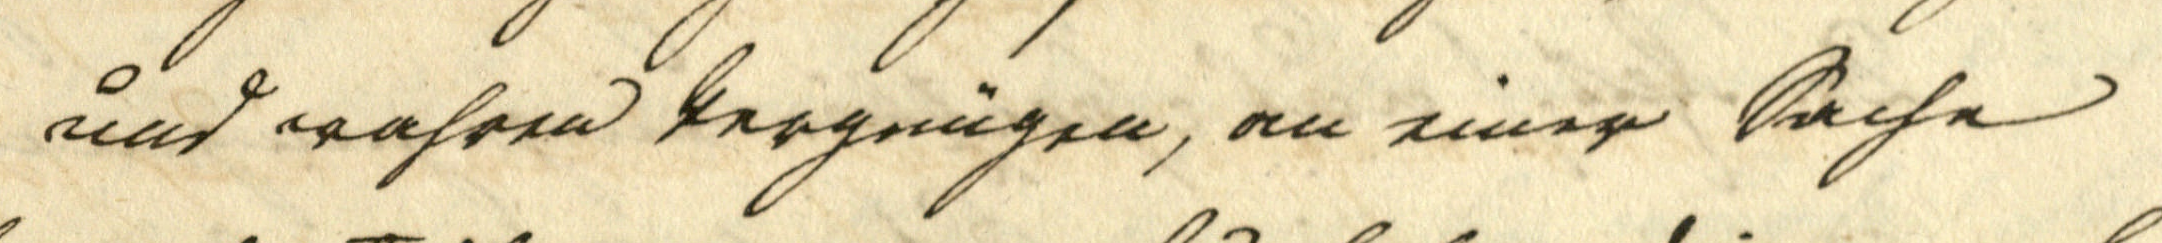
gung und wahren Vergnügen, an einer Sache
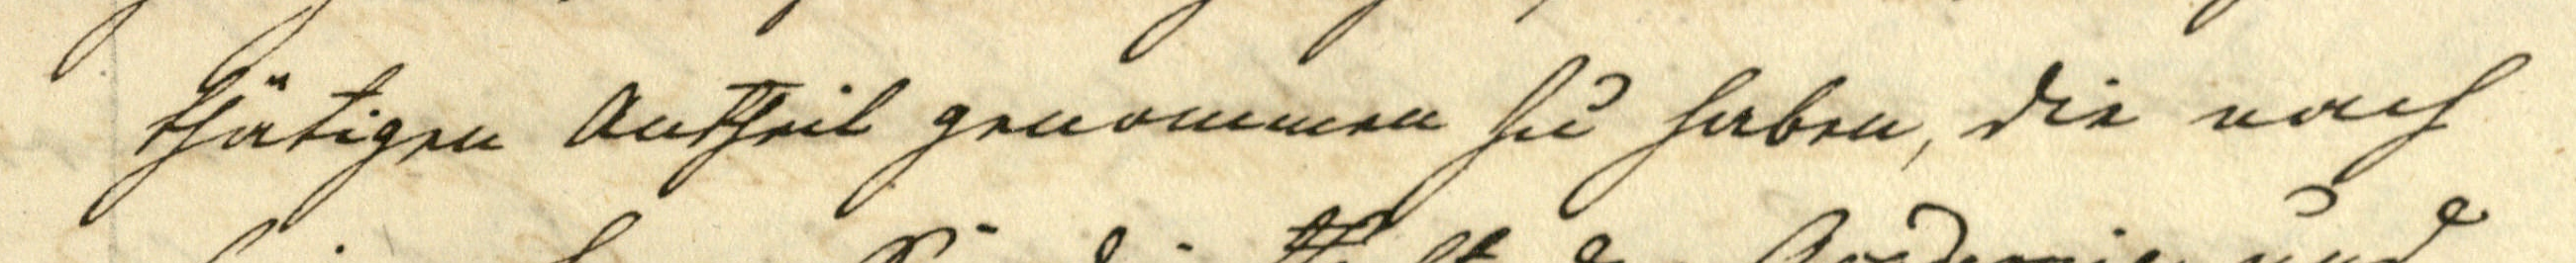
thätigen Antheil genommen zu haben, die nach
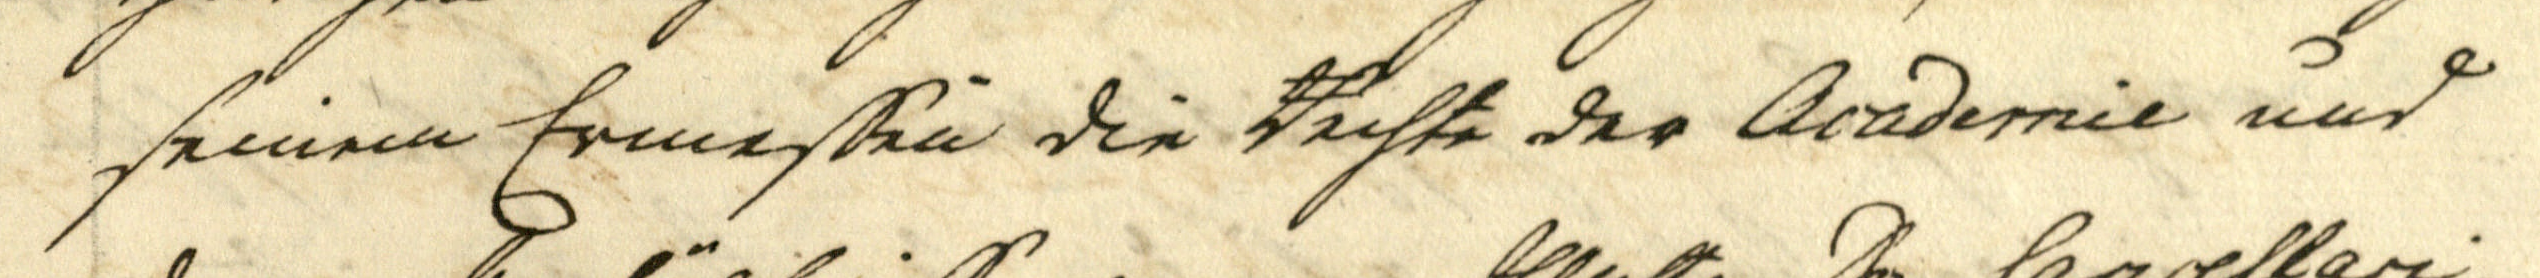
seinem Ermessen die Rechte der Academie und
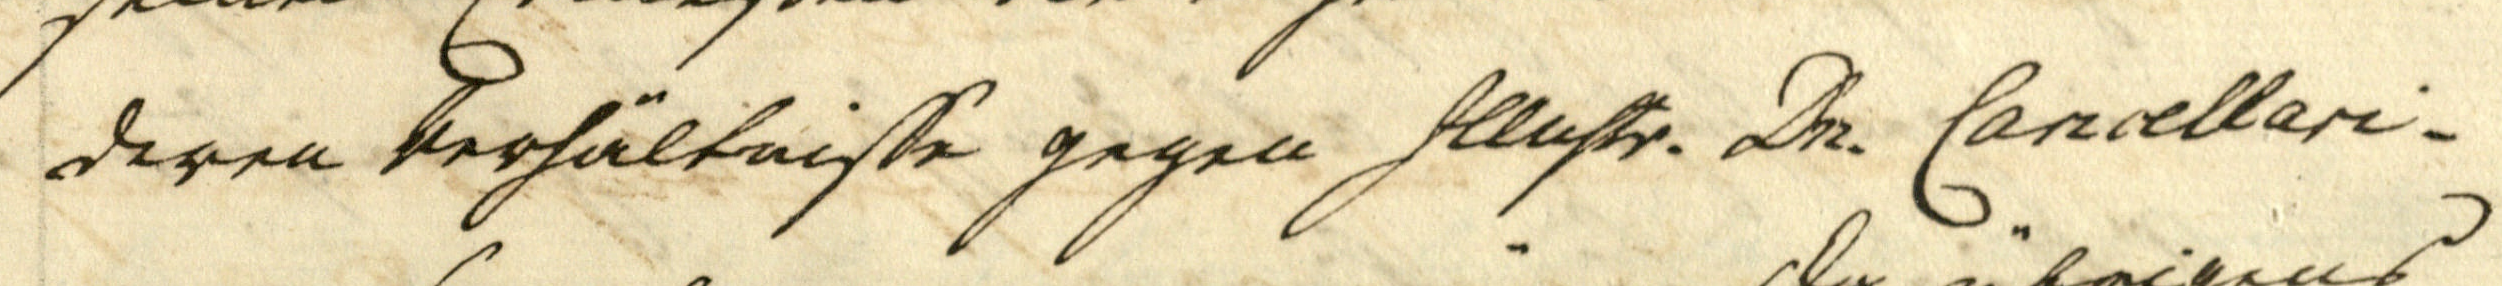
deren Verhältnisse gegen Illustr. Dn. Cancellari¬
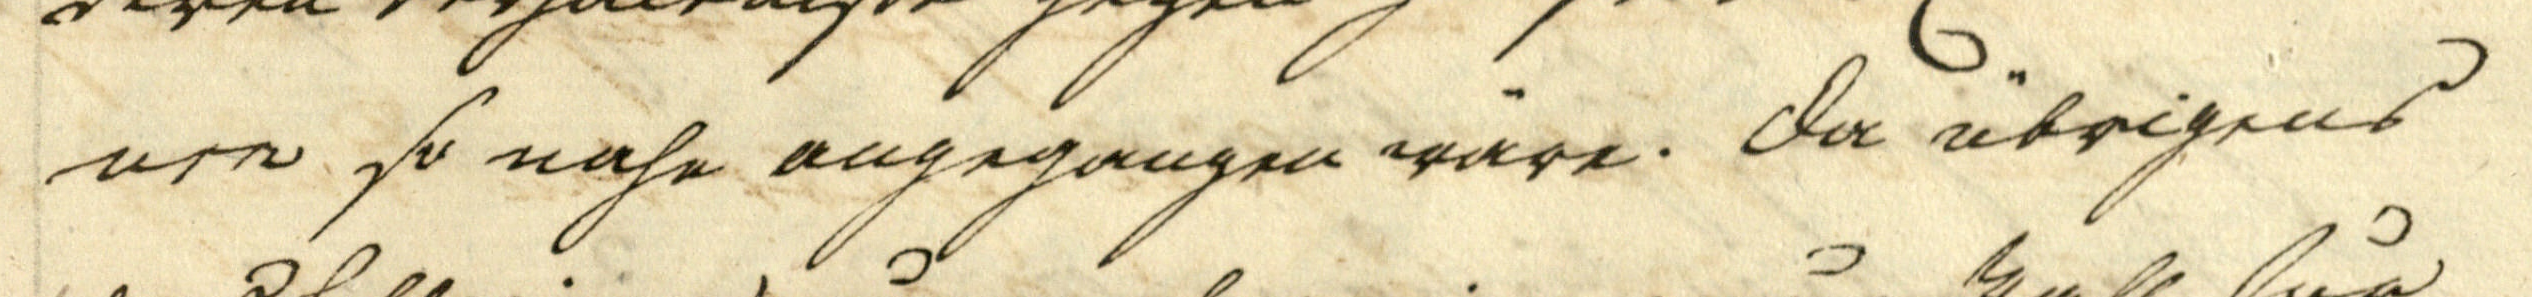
um so nahe angegangen wäre. Da übrigens
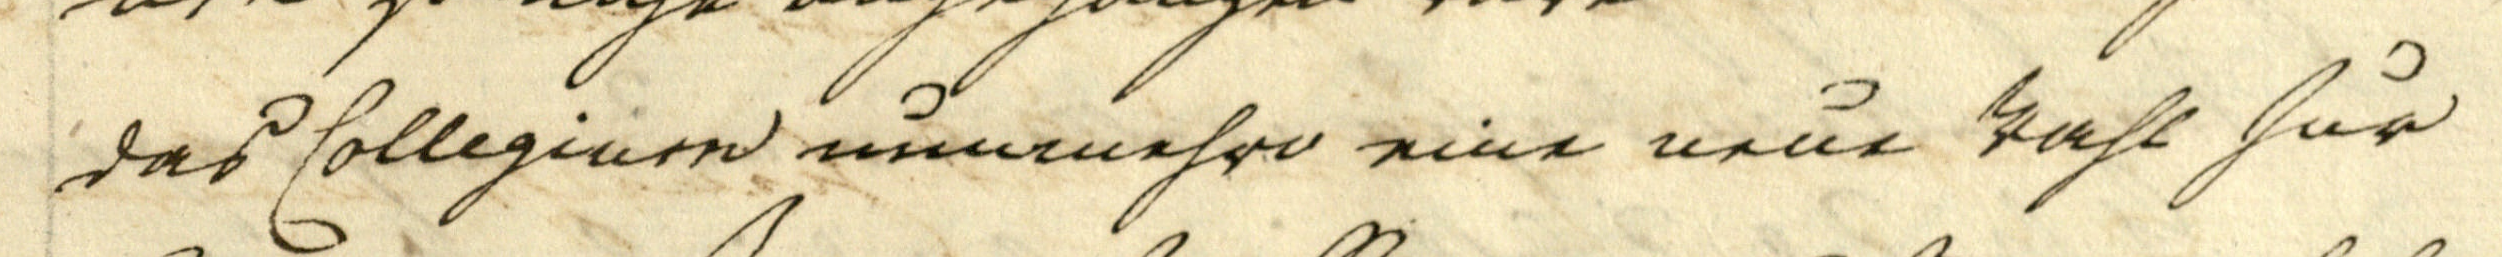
das Collegium nunmehro eine neue Wahl zur
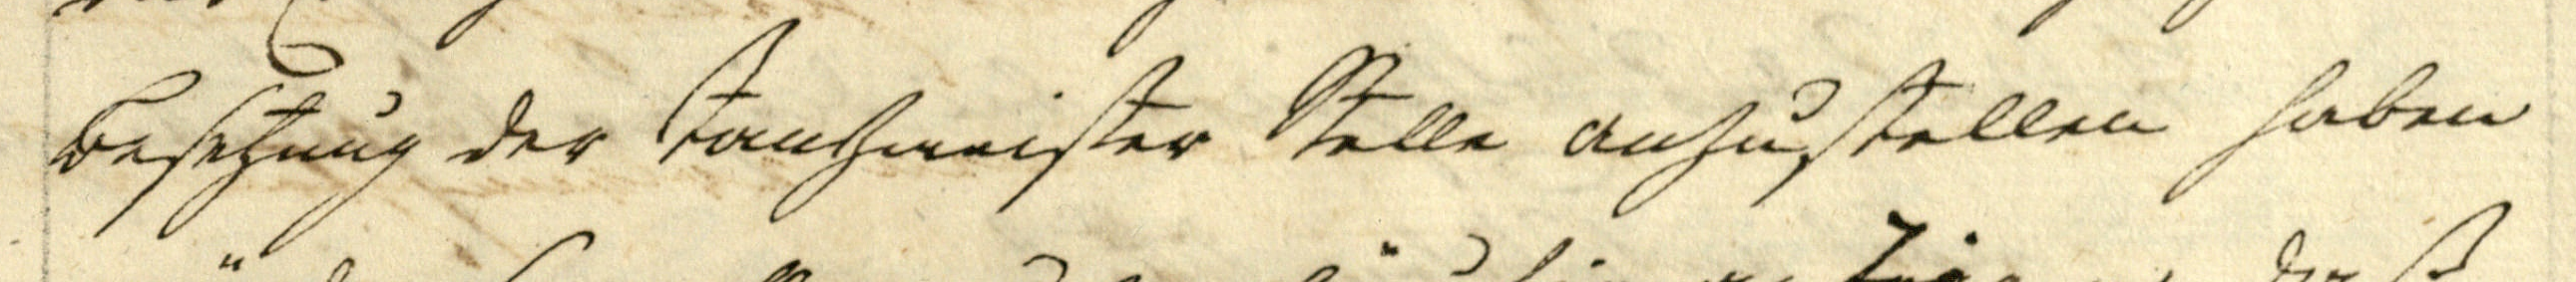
Besetzung der Tanzmeister Stelle anzustellen haben
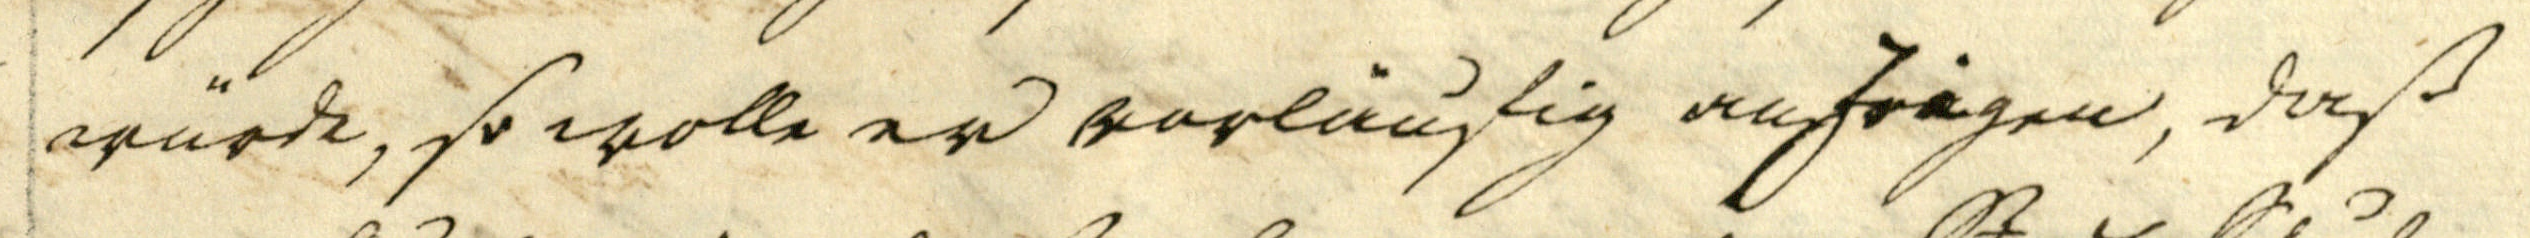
würde, so wolle er vorläufig anfragen, daß
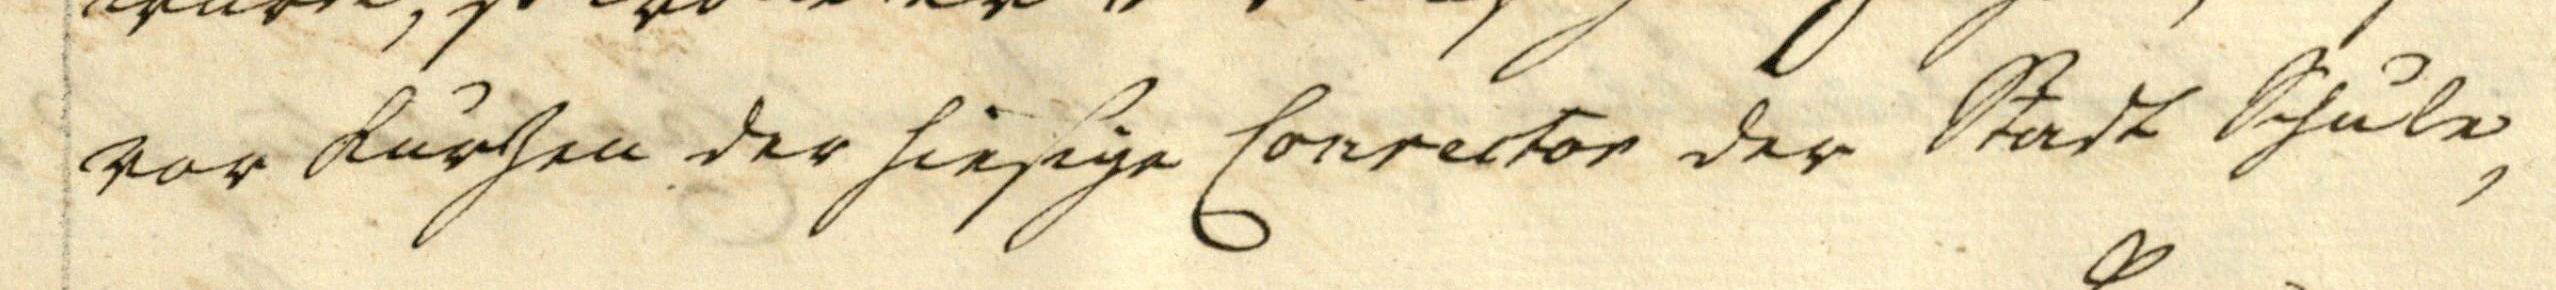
vor kurzen der hiesige Conrector der Stadt Schule,
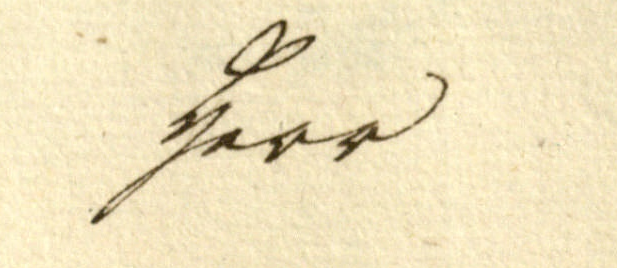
Herr
